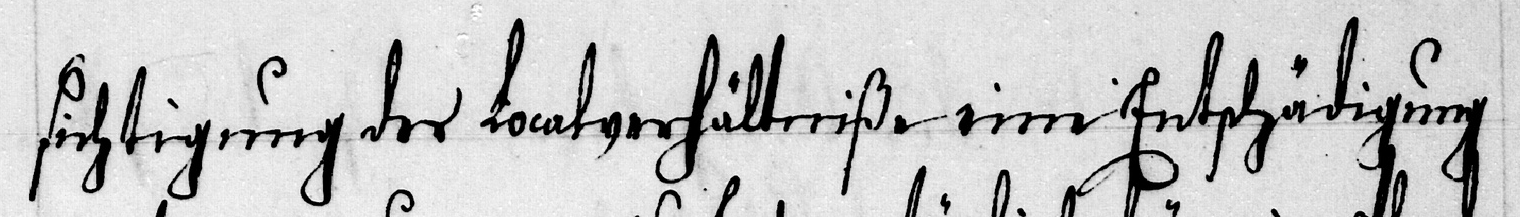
sichtigung der Localverhältniße eine Entschädigung
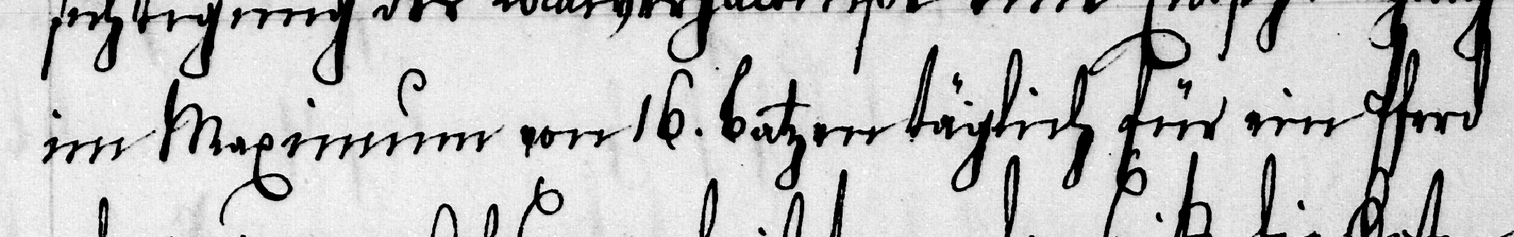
im Maximum von 16. Batzen täglich für ein Pferd
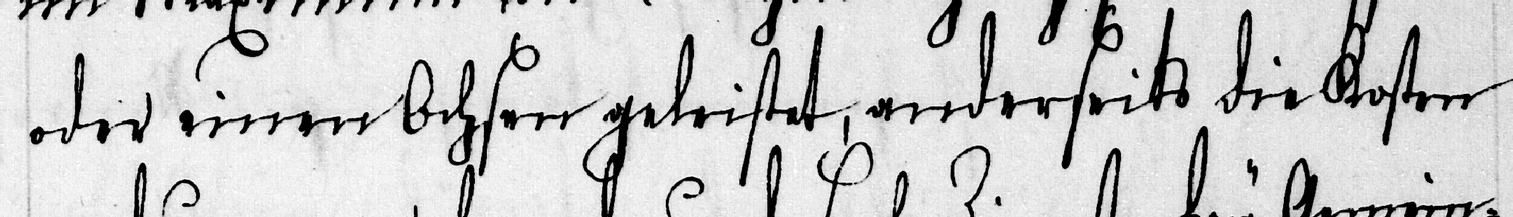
oder einen Ochsen geleistet, anderseits die Kosten
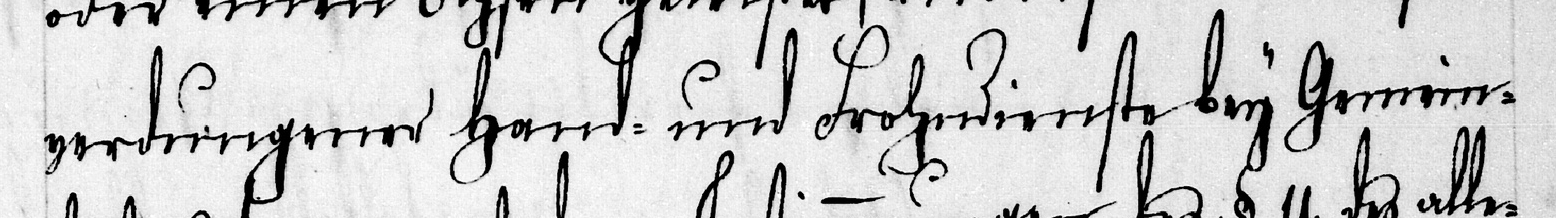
verdungener Hand- und Frohndienste bey Gemein¬
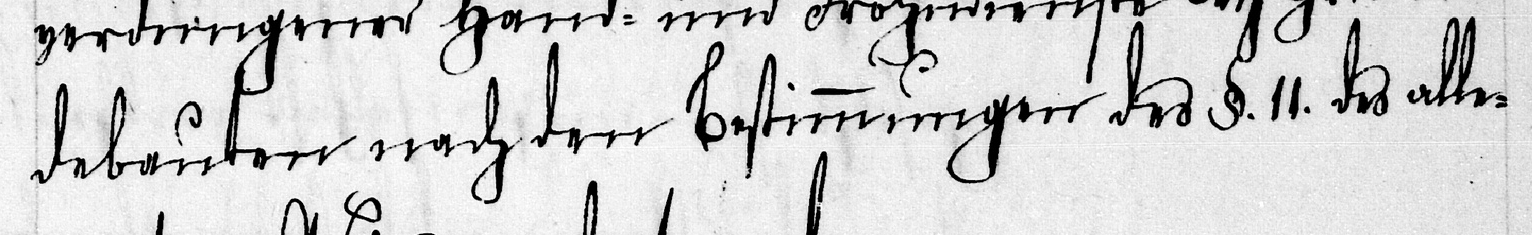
debauten nach den Bestimmungen des §. 11. des all¬
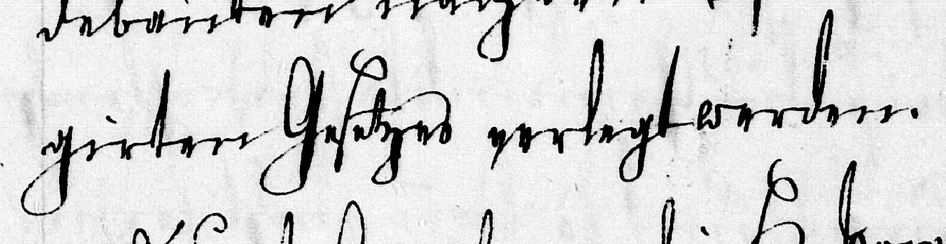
egirten Gesetzes verlegt werden.
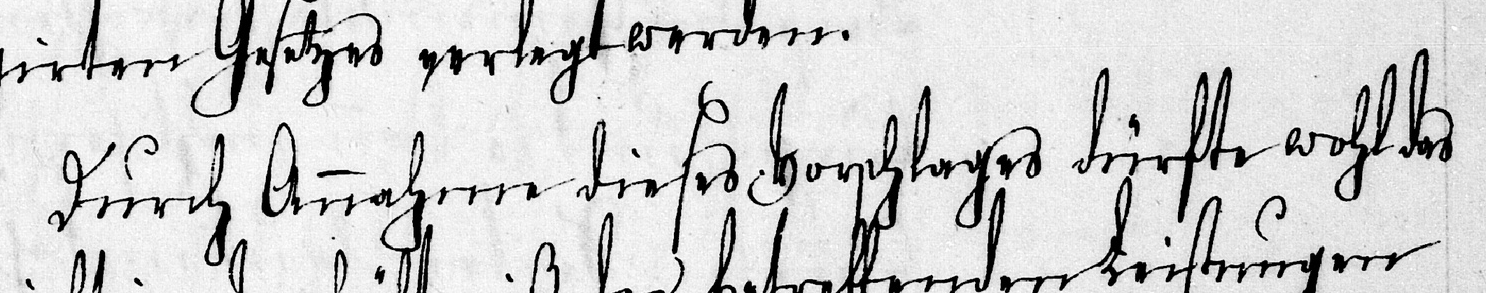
Durch Annahme dieses Vorschlages dürfte wohl das
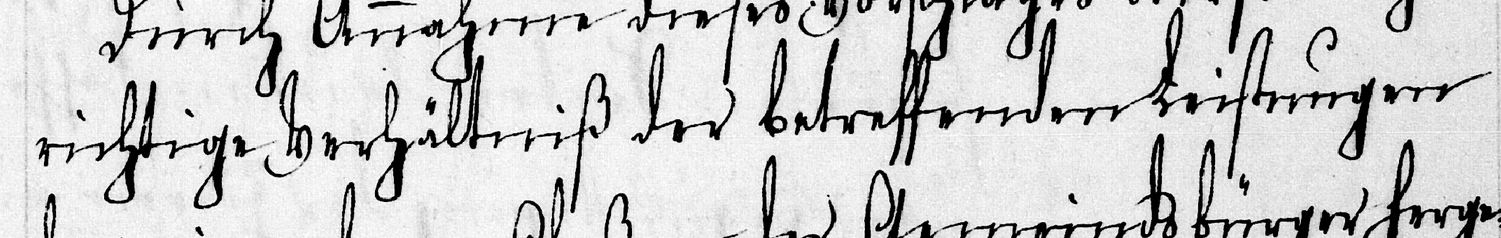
richtige Verhältniß der betreffenden Leistungen
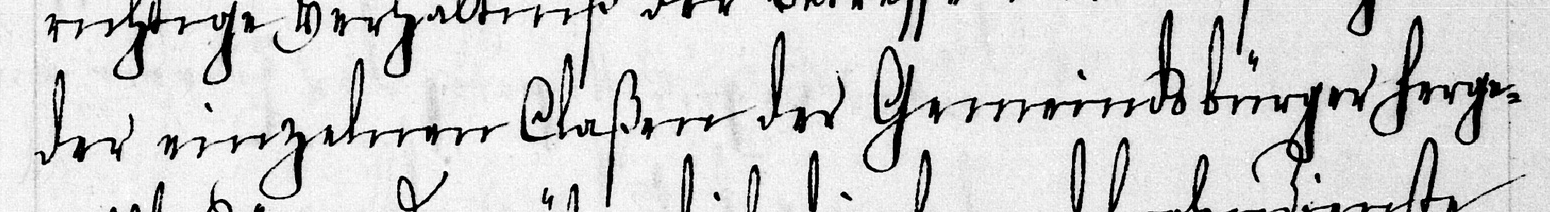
der einzelnen Claßen der Gemeindsbürger herges¬
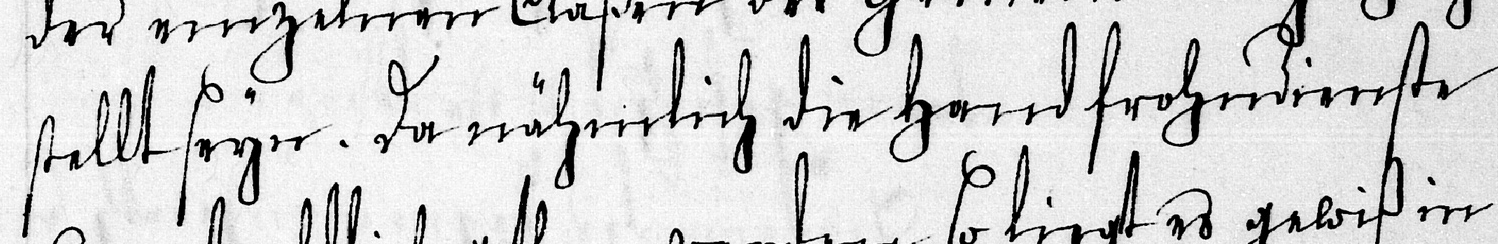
tellt seyn. Da nähmlich die Handfrohndienste
